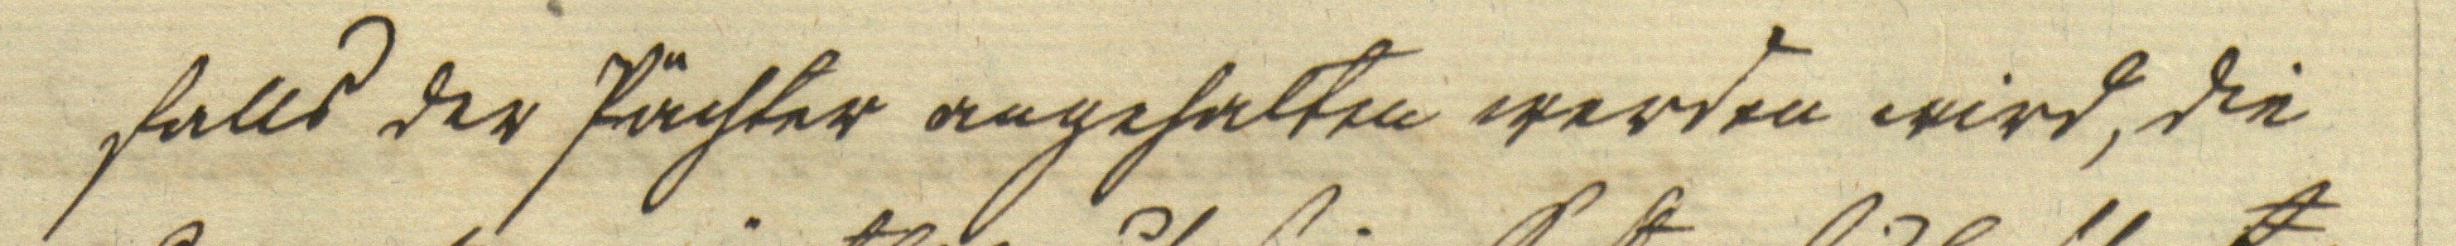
falls der Pächter angehalten werden wird, die
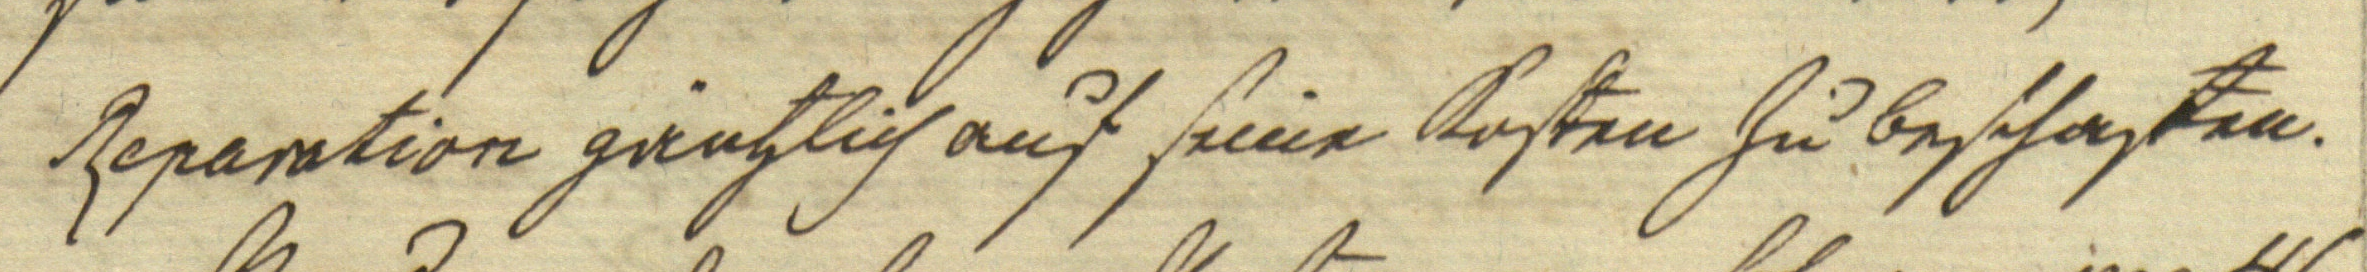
Reparation gäntzlich auf seine Kosten zu beschaffen.
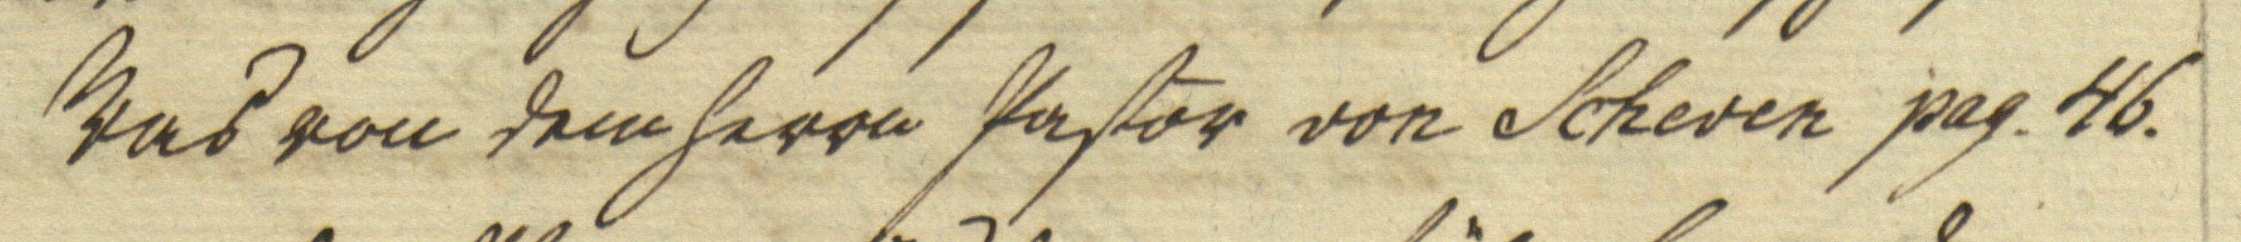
Was von dem Herrn Pastor von Scheven pag. 46.
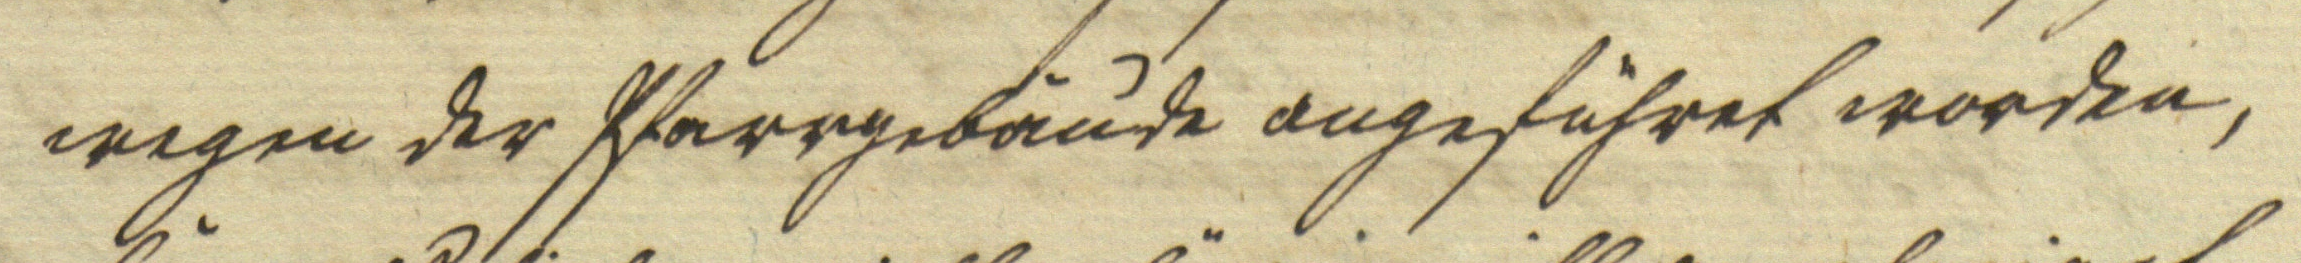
wegen der Parrgebäude angeführet worden,
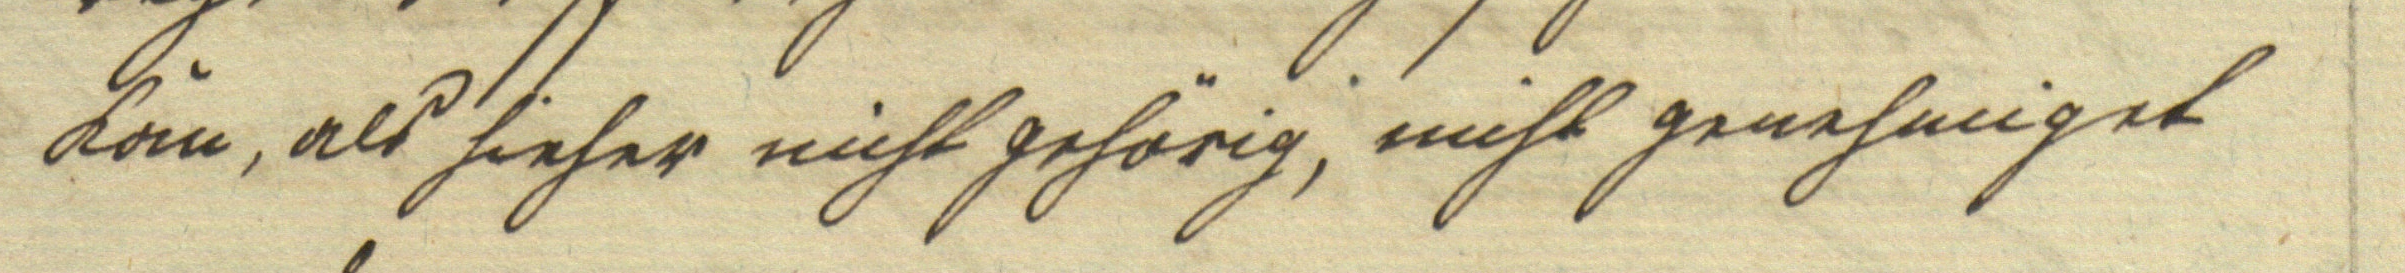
kan, als hieher nicht gehörig, nicht genehmiget
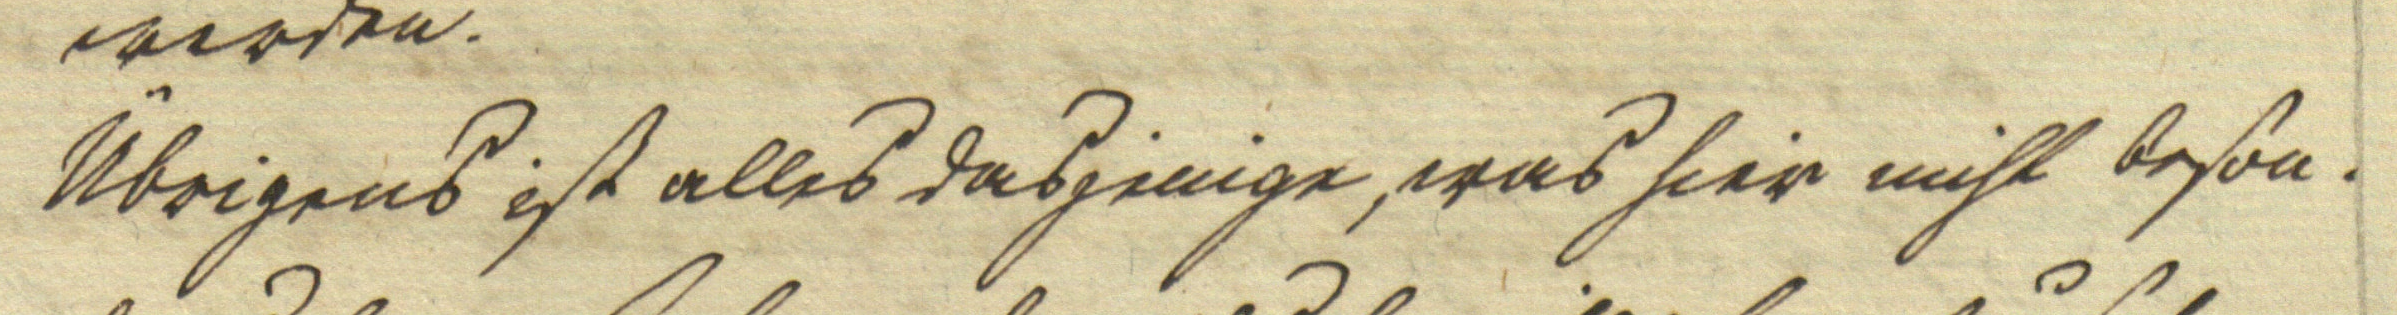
Übrigens ist alles dasjenige was hier nicht beson¬
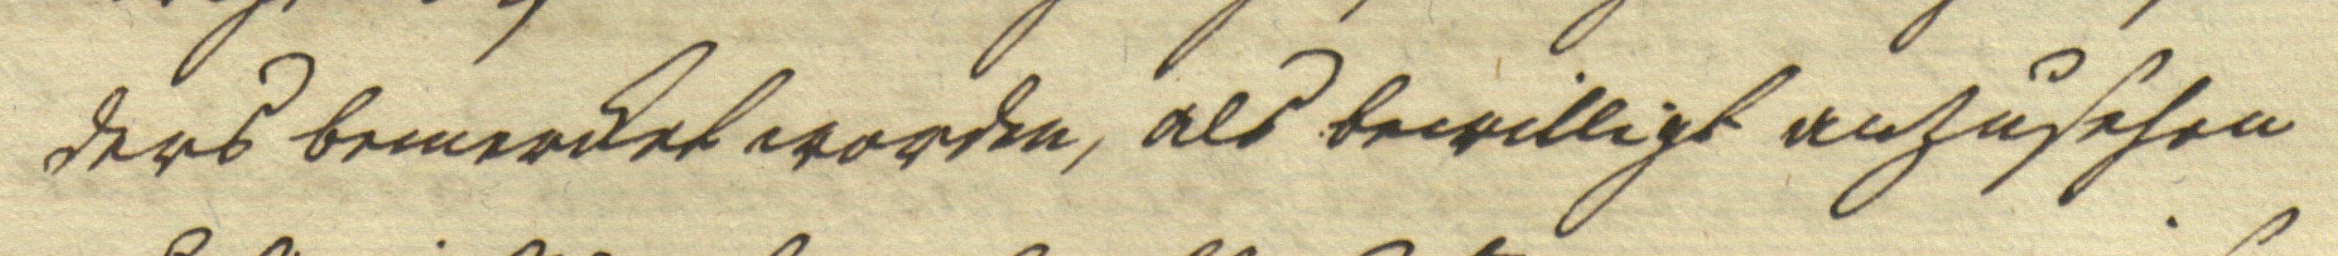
ders bemercket worden, als bewilligt anzusehen
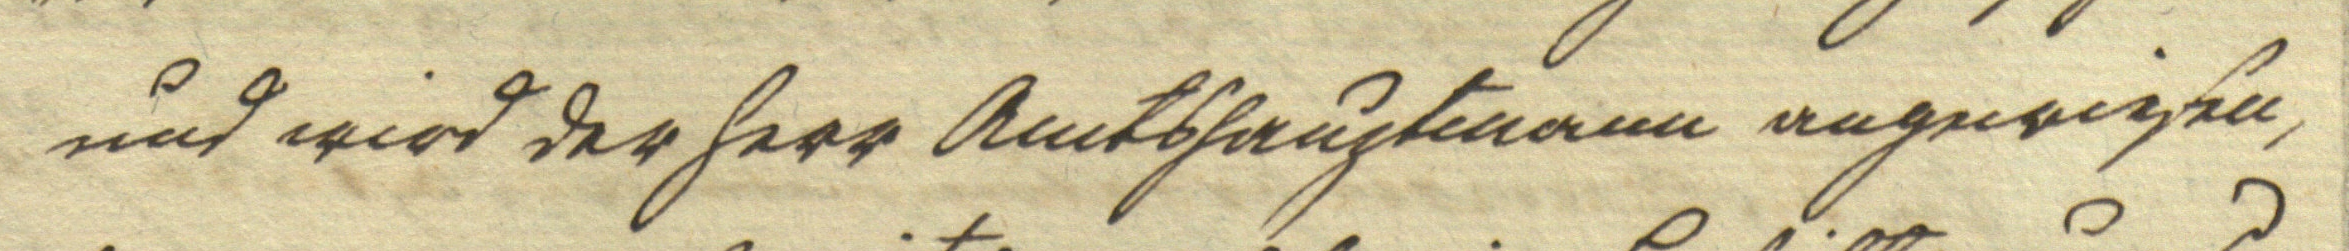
und wird der Herr Amtshauptmann angewiesen,
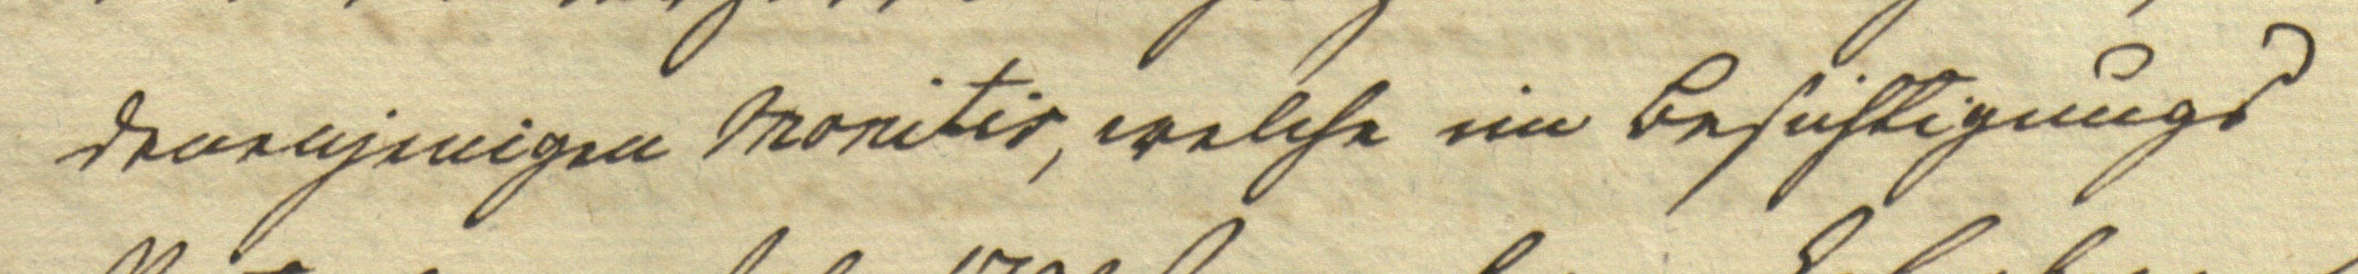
denenjenigen Monitis, welche im Besichtigungs
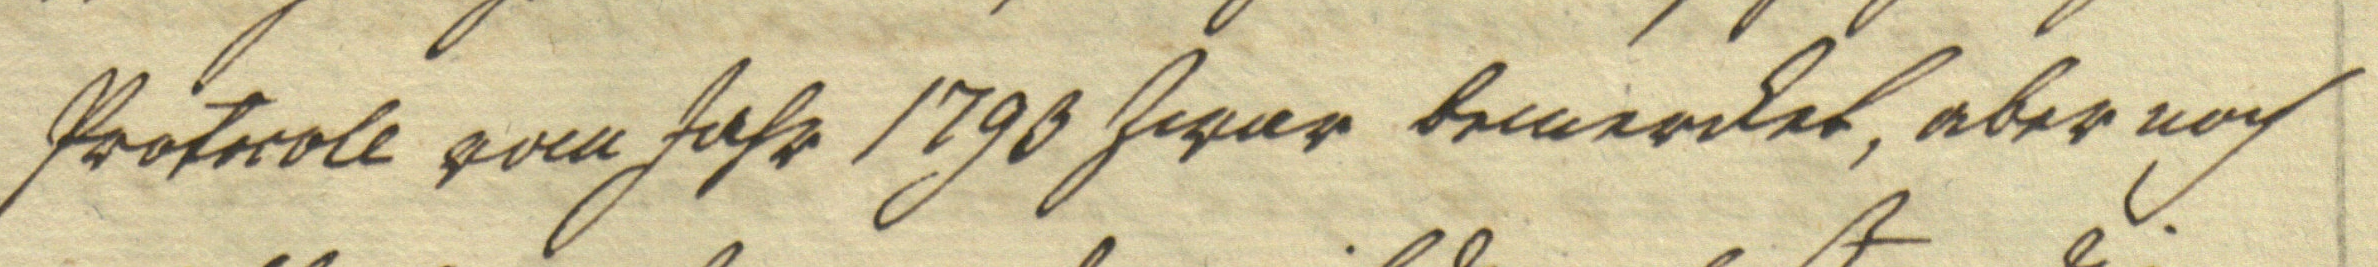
Protocoll vom Jahr 1793 zwar bemercket, aber noch
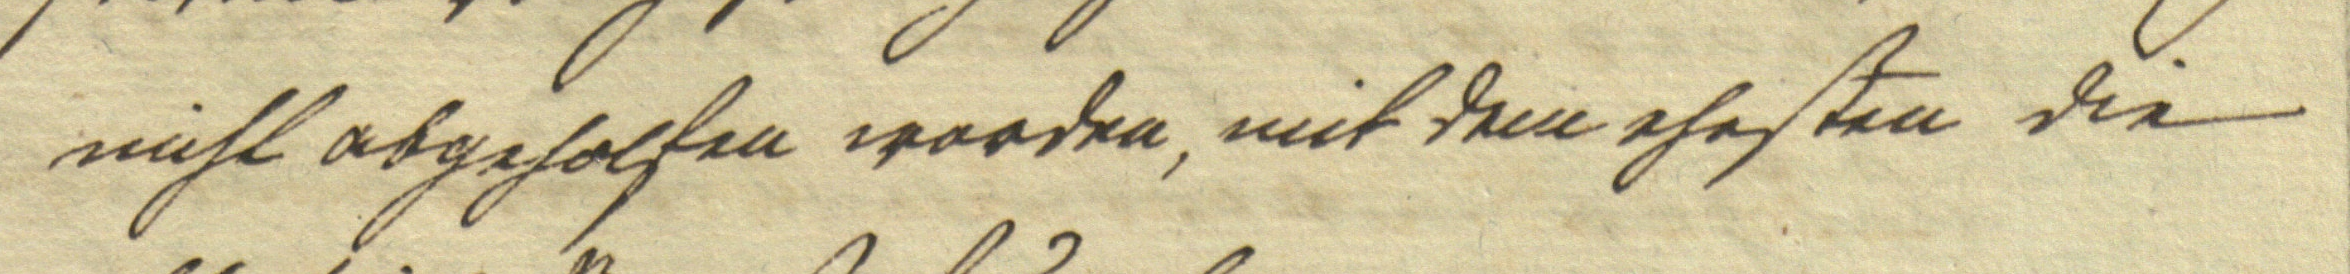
nicht abgeholfen worden, mit dem ehesten die
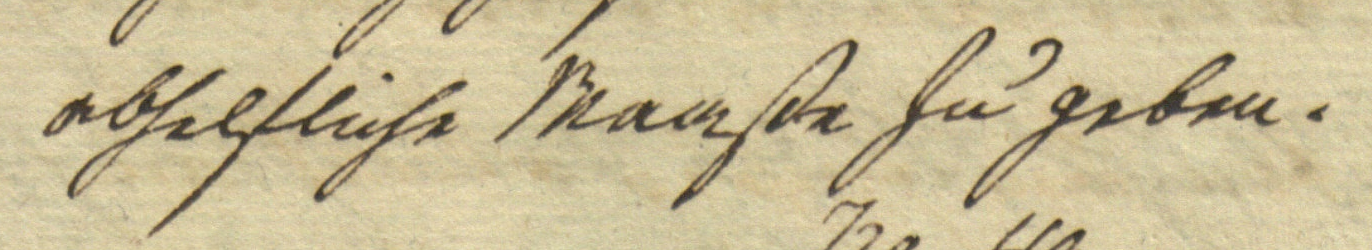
abhelfliche Maaße zu geben.
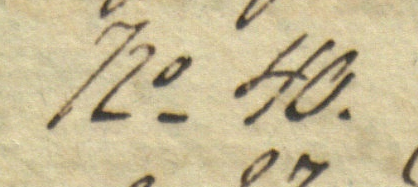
No 40.
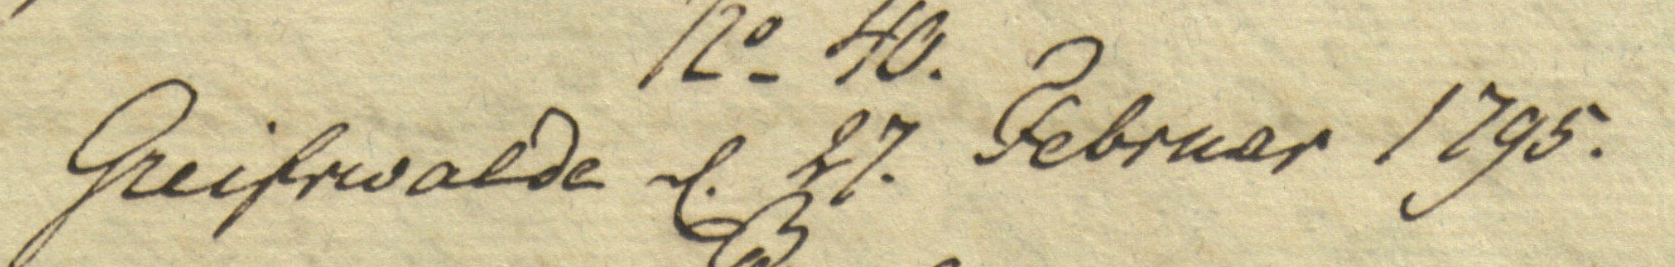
Greifswalde d. 27. Februar 1795.
